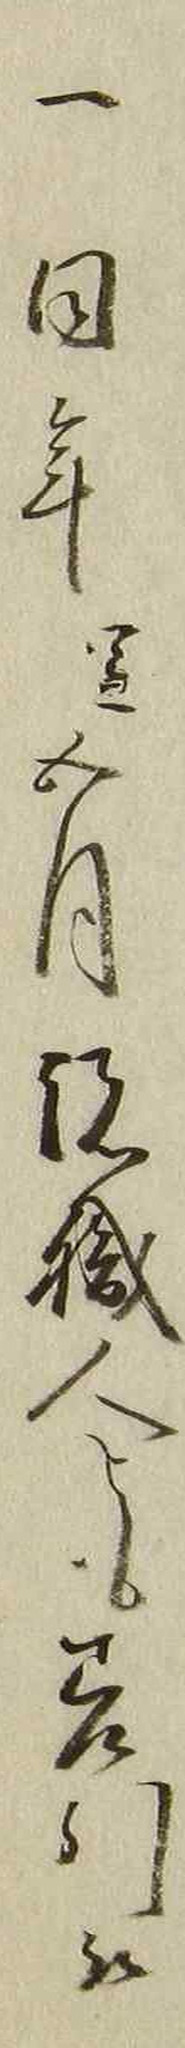一同年閏五月諸職人とも差引被
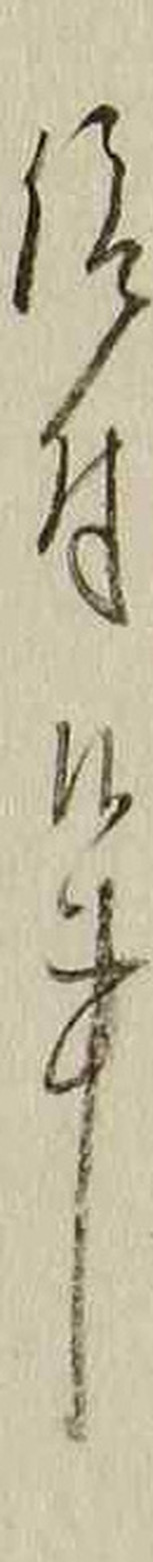仰付候事
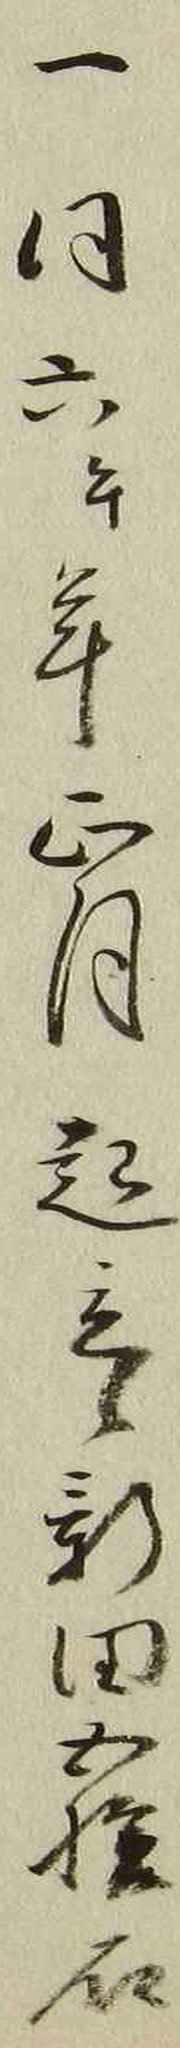一同六午年正月起立之新田五拾石
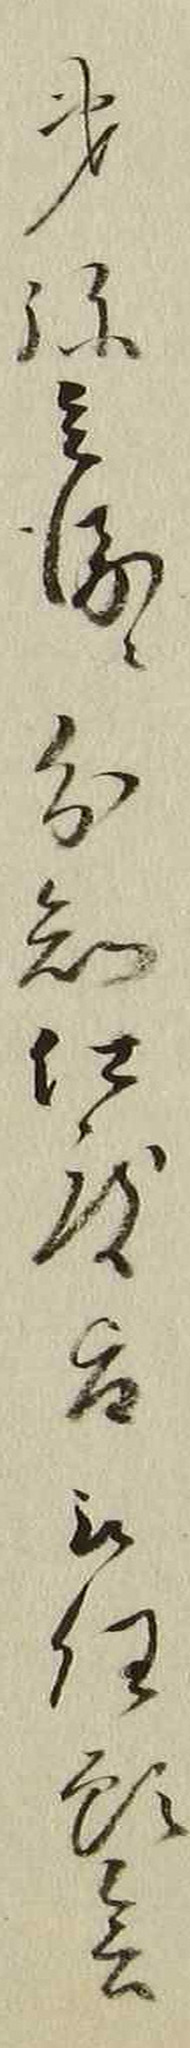弟弥兵衛ニ分知仕度旨被任願会
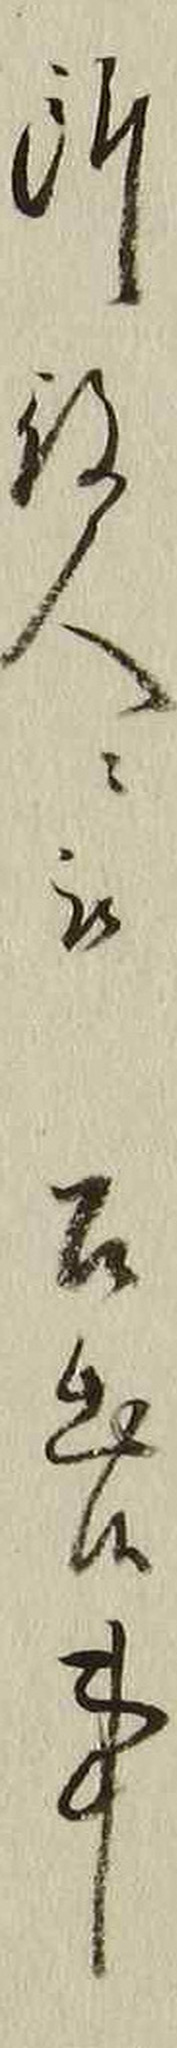所役人ニ被召出候事
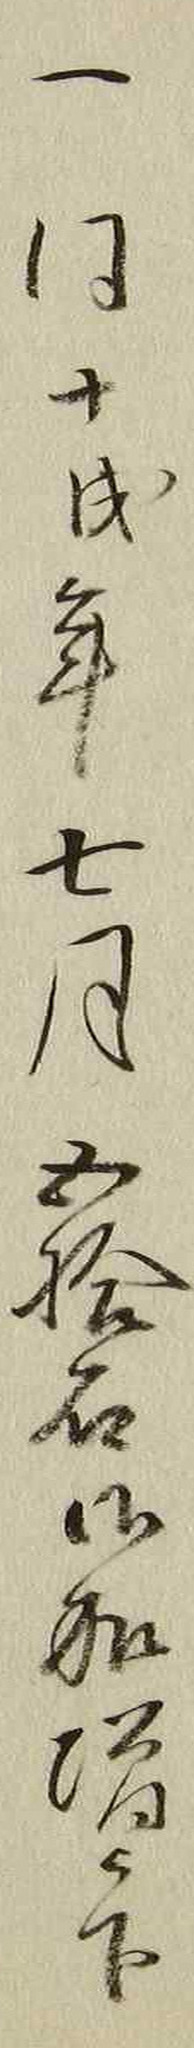一同十戌年七月五拾石御加増被下
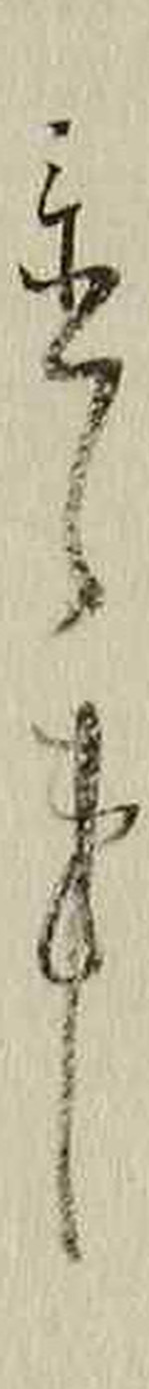置候事
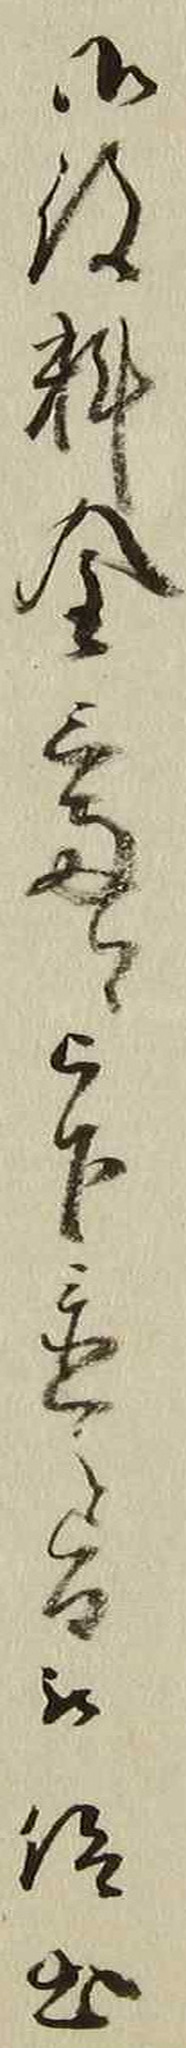御役料金三両つゝ被下置之旨被仰出
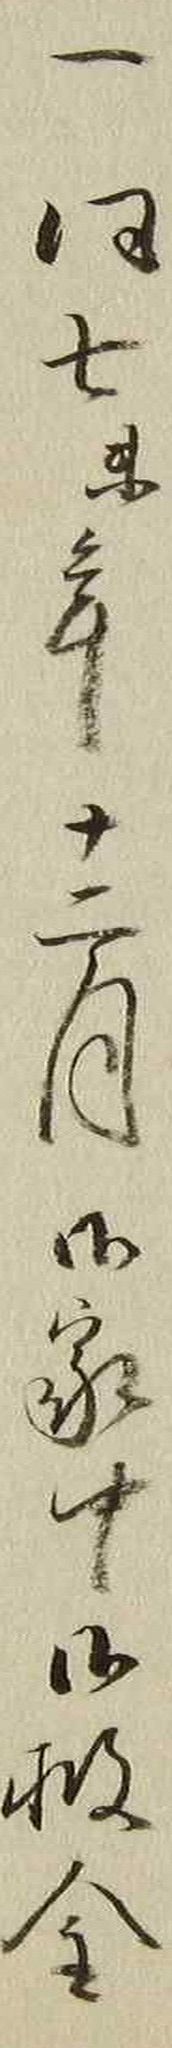一同七未年十二月御家中御救金
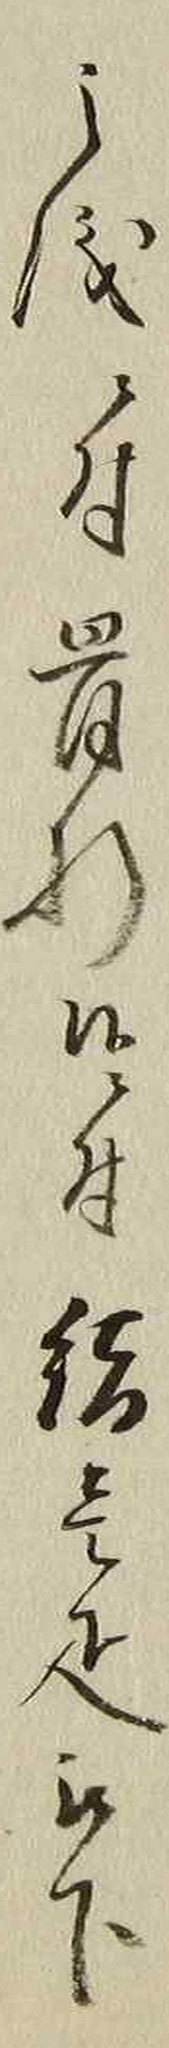之儀ニ付骨折候ニ付絹壱疋被下
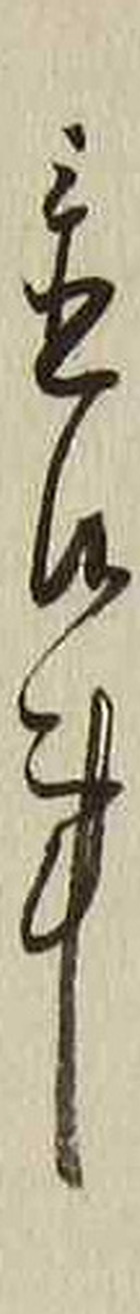置候事
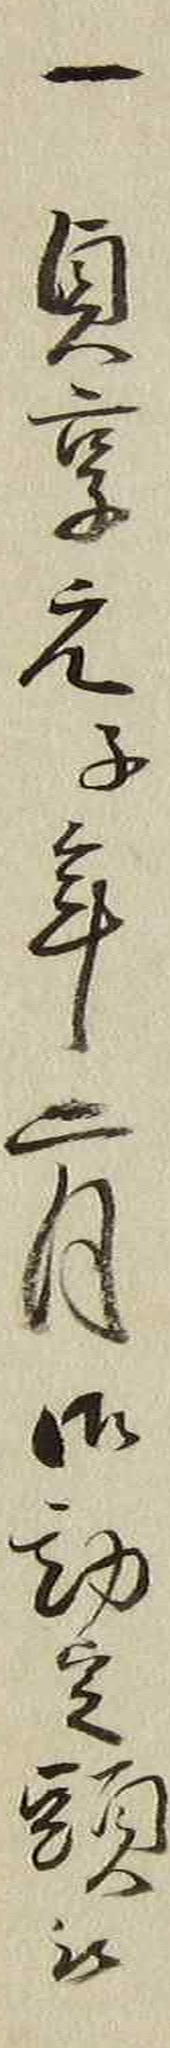一貞享元子年二月御勘定頭被
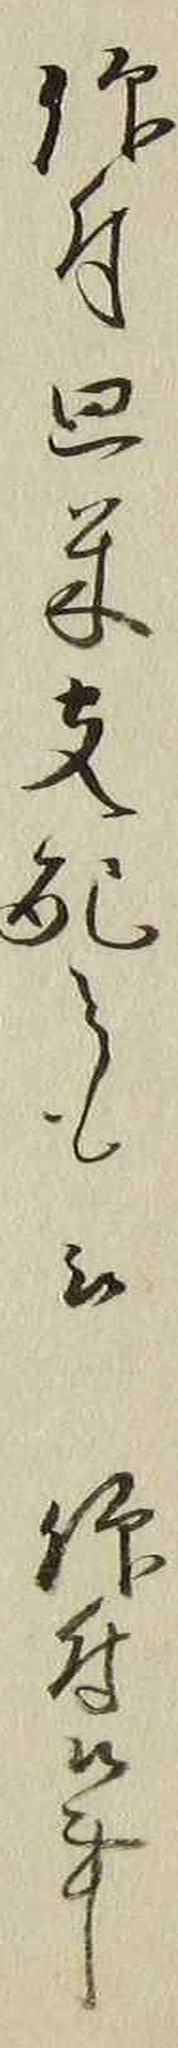仰付廻米支配をも被仰付候事
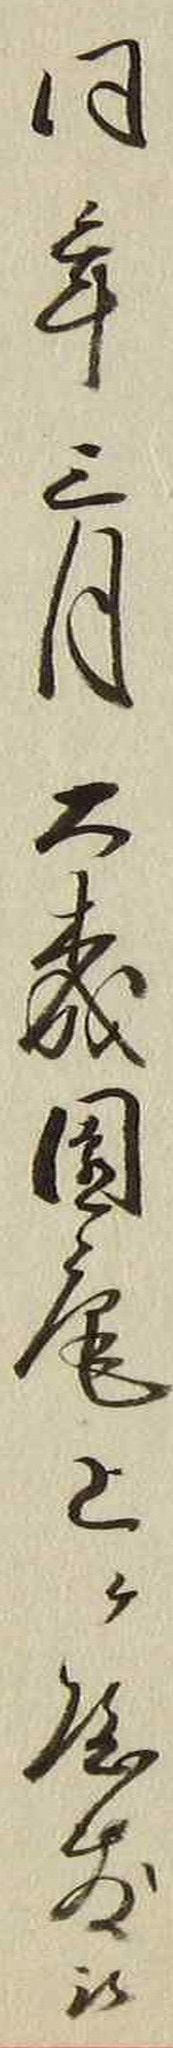同年三月大森園尾上ケ屋敷被
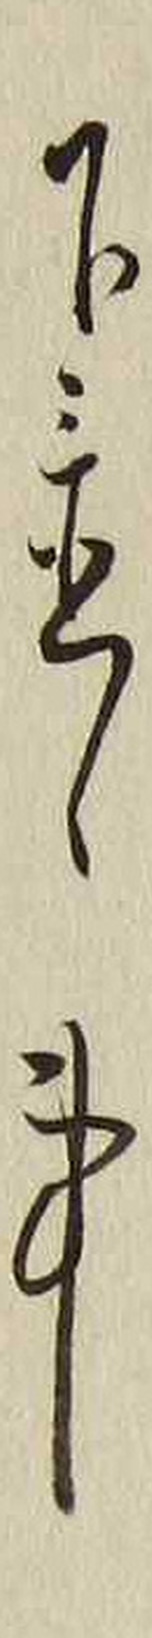下置候事

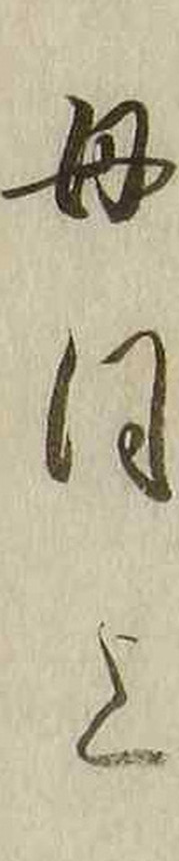母同上
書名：諸士系譜　巻之32　い之部32
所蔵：会津若松市立会津図書館
